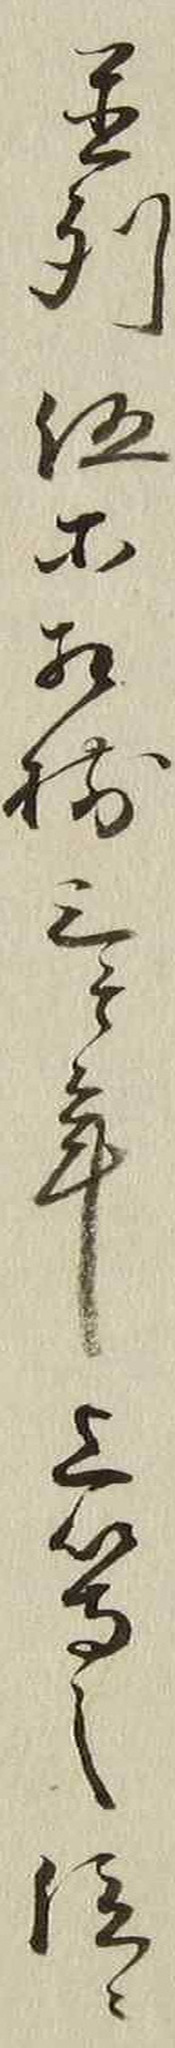並列伍等相揃え三ケ年上等之位ニ
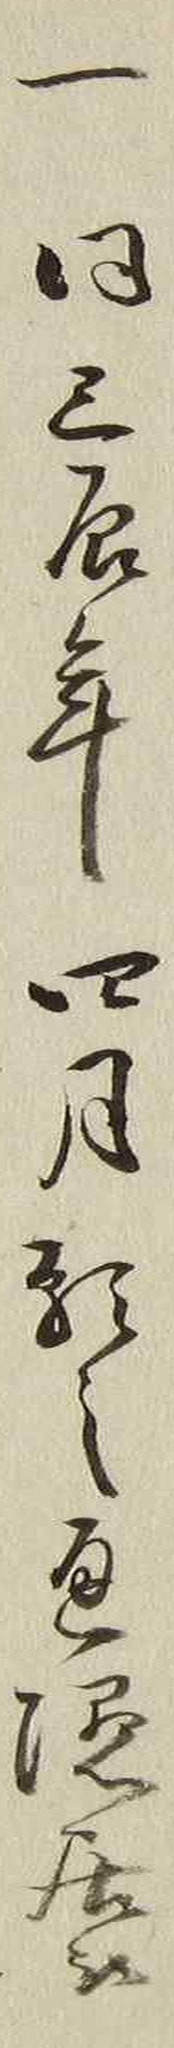一同三辰年四月願い之通り隠居
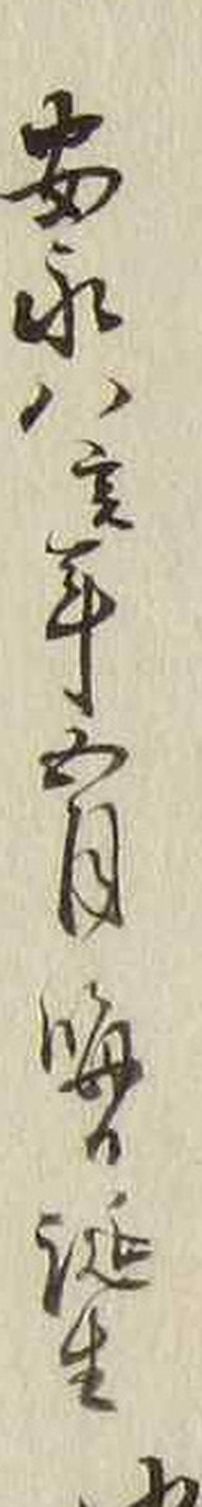安永八亥年五月晦日誕生

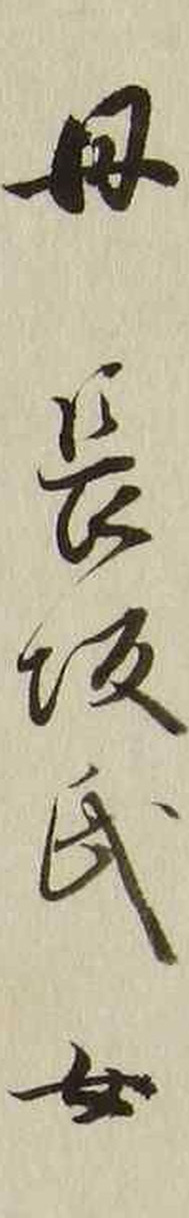母長坂氏女
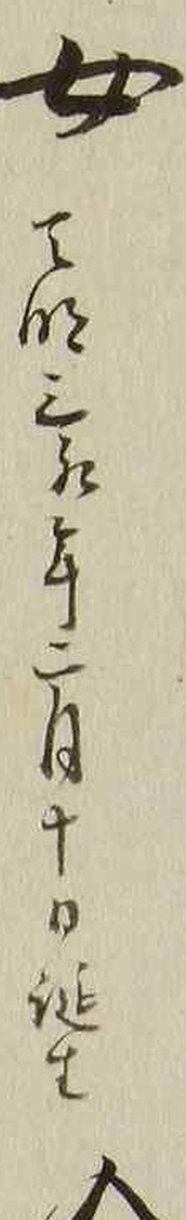天明三卯年二月十日誕生
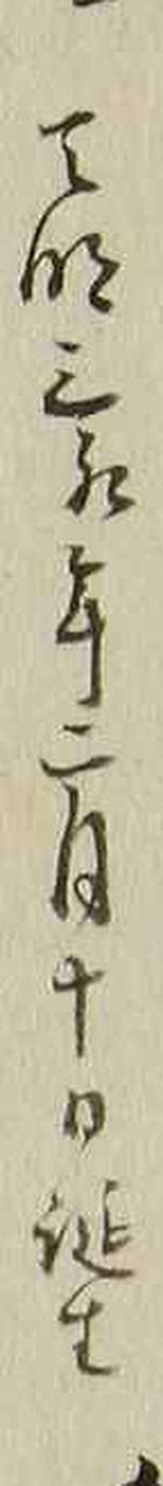天明三卯年二月十日誕生
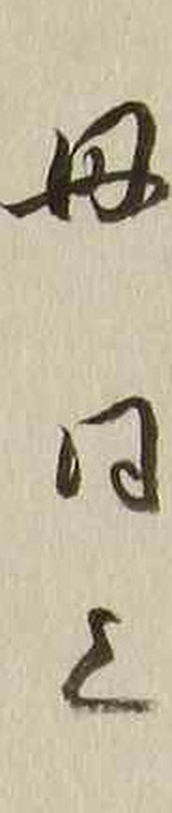母同上
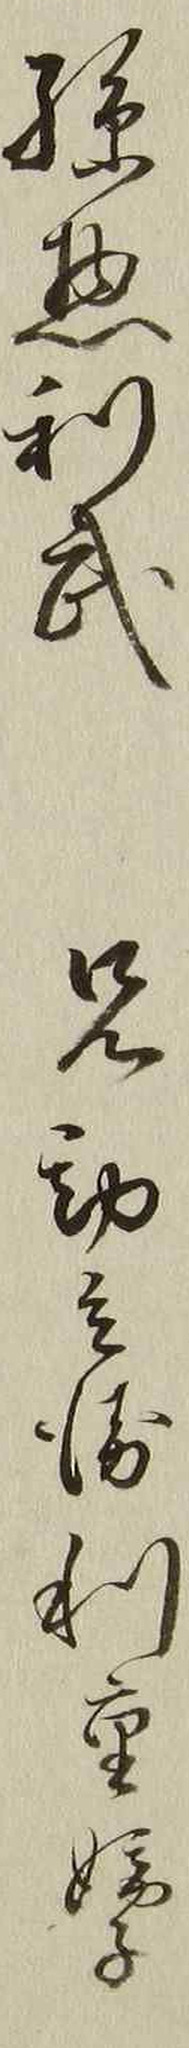孫惣利武兄勘兵衛利重嫡子
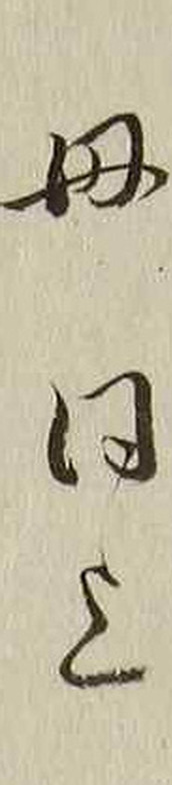母同上
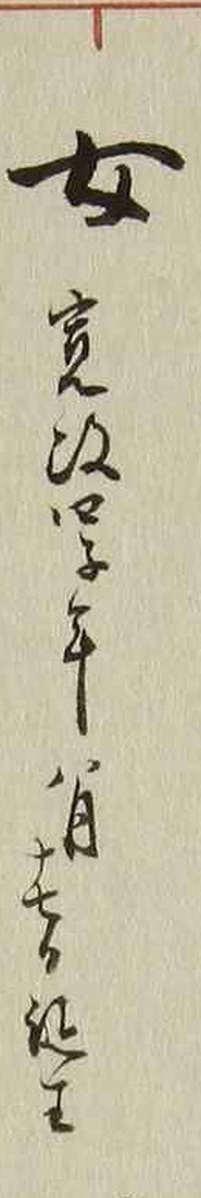寛政四子年八月十七日誕生
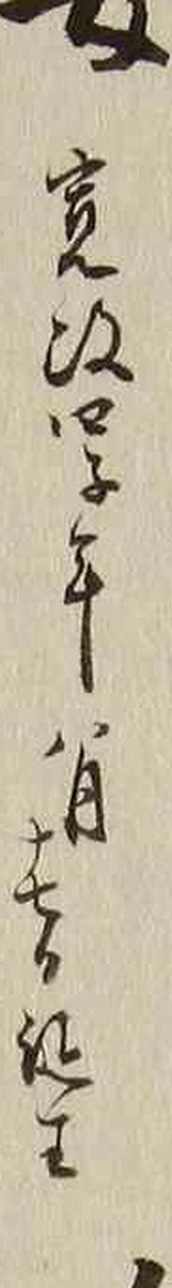寛政四子年八月十七日誕生
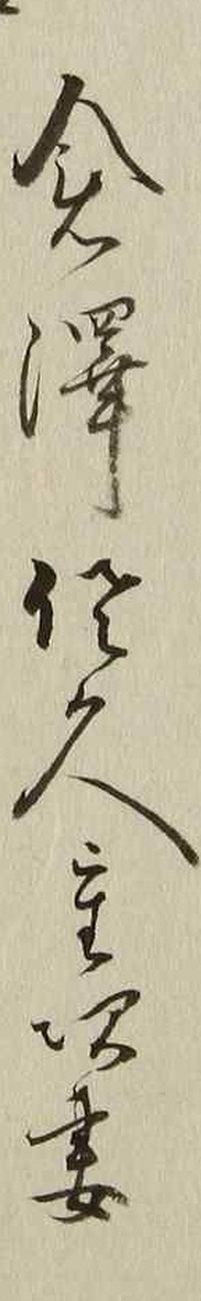女会澤佐久重次妻
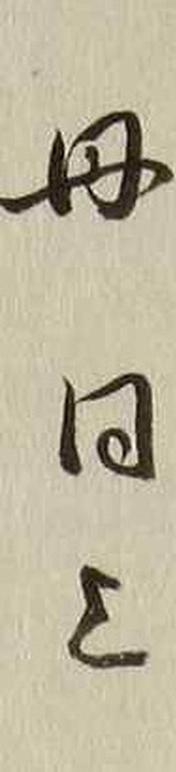母同上
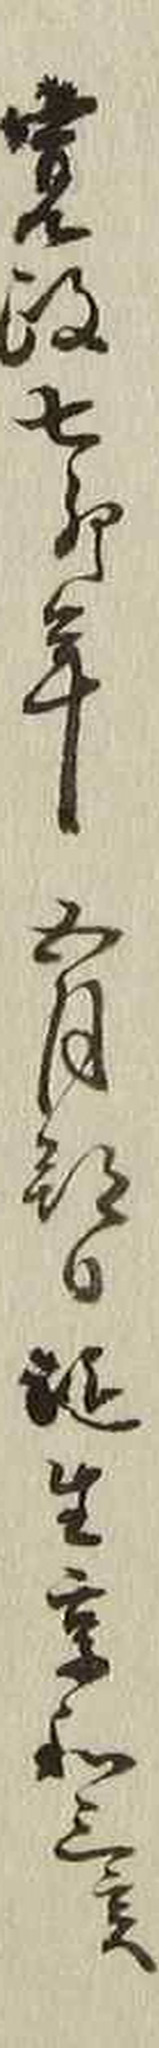寛政七卯年五月朔日誕生享和三亥
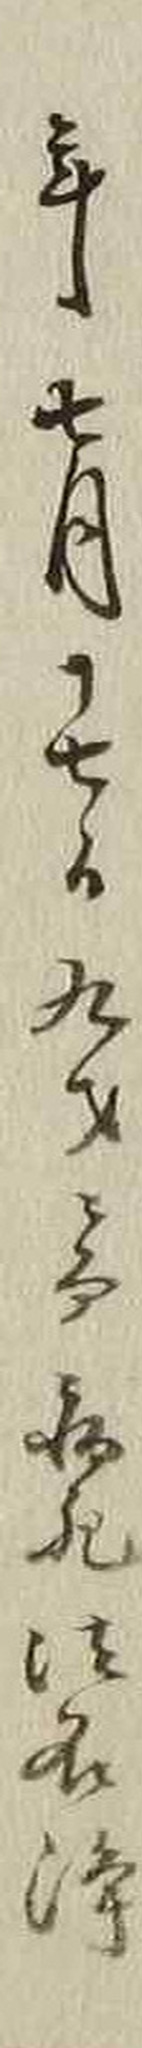八弥年七月十七日九ニて病死法名浄
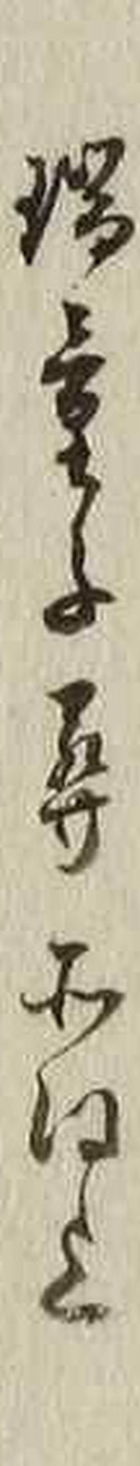瑞童子葬所同上
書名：諸士系譜　巻之20　い之部20
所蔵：会津若松市立会津図書館
